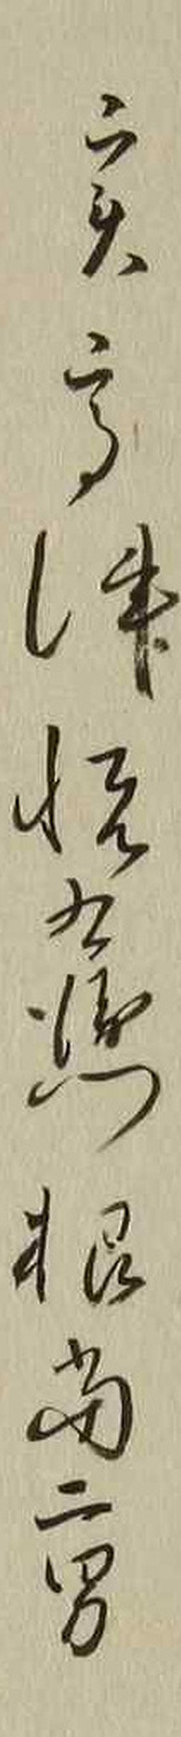実高津悦右衛門根当二男
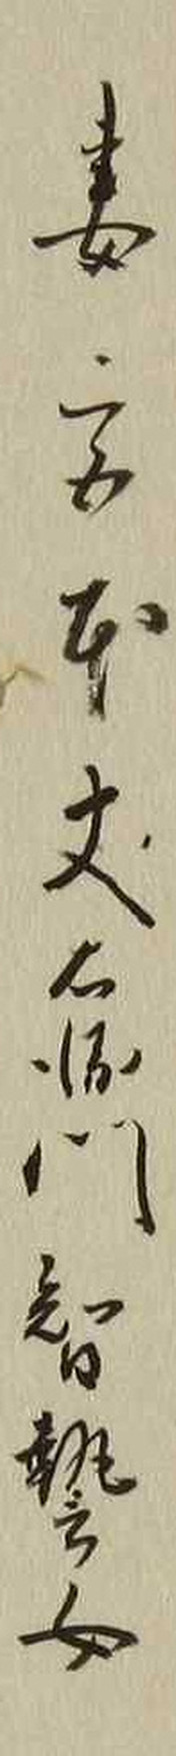妻宮本丈右衛門智女
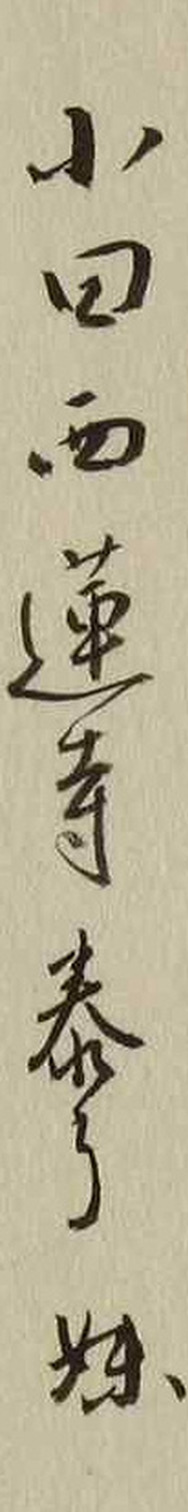小田西蓮寺泰了妹
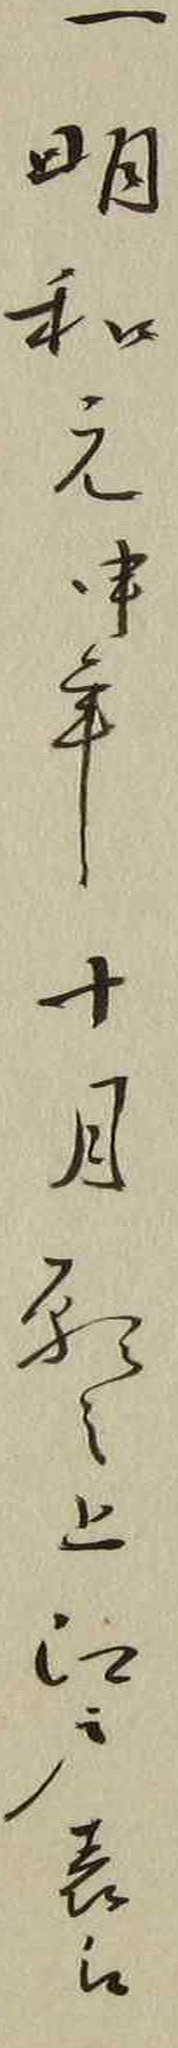一明和元申年十月願之上江戸表江
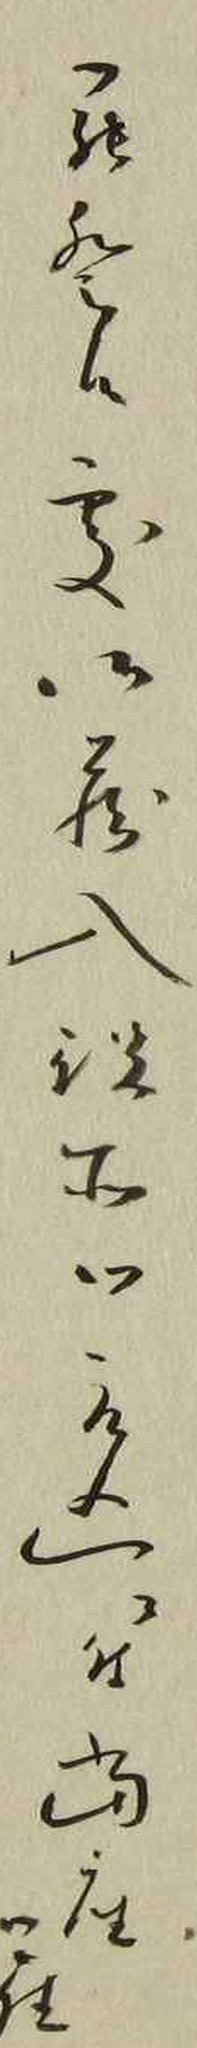罷登候処御蔵入役所御取込ニ付当座御雇
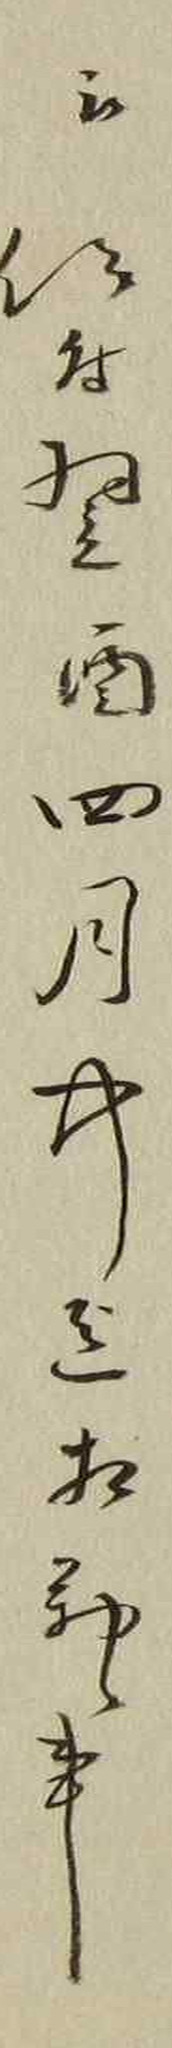被仰付翌酉四月中迄相勤候事
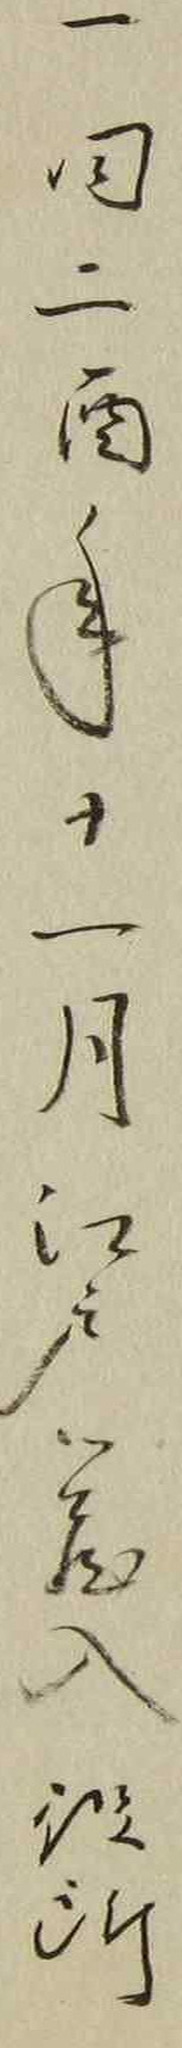一同二酉年十一月江戸御蔵入役所
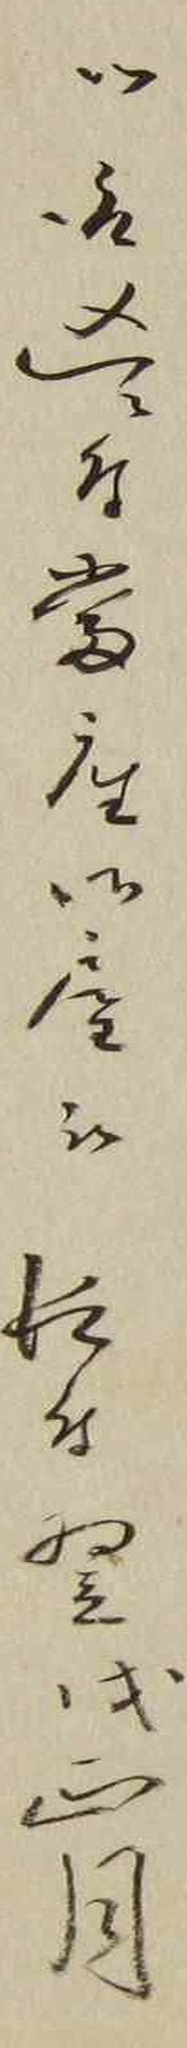御取込ニ付当座御雇被仰付翌戌正月
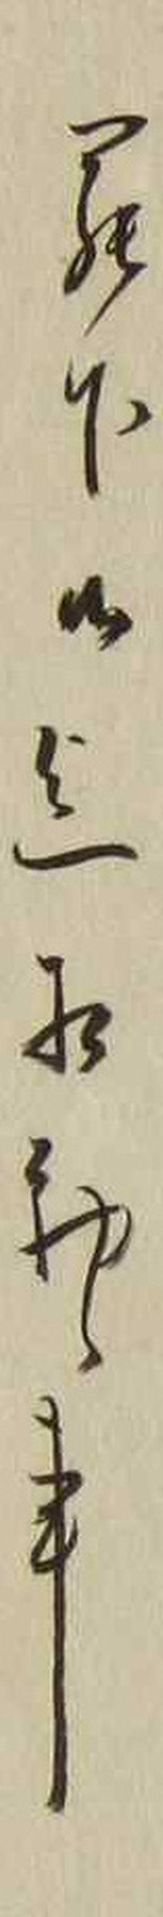罷下候迄相勤候事

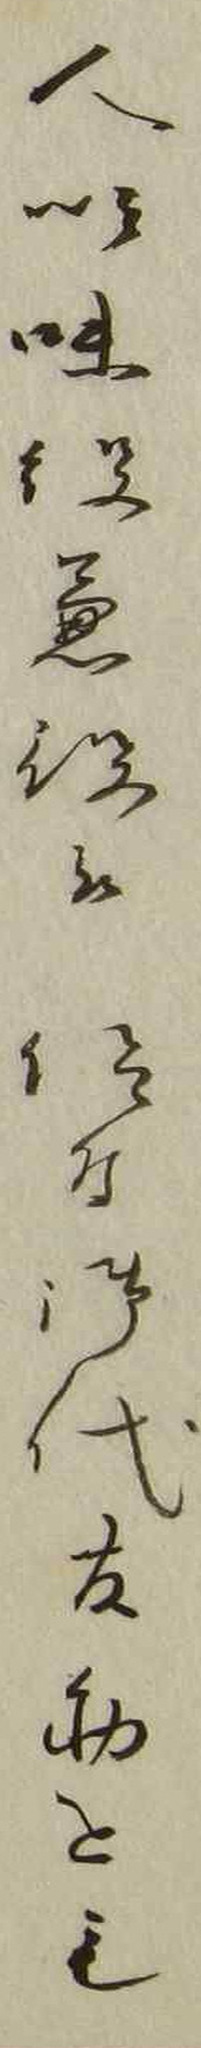人吟味役兼役被仰付御代官勤をも
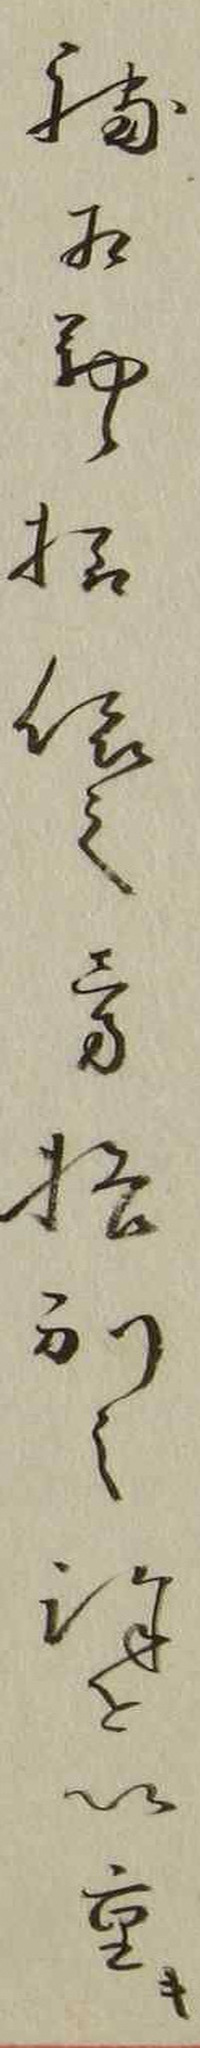補相勤候様依之旁格別之訳を以重キ
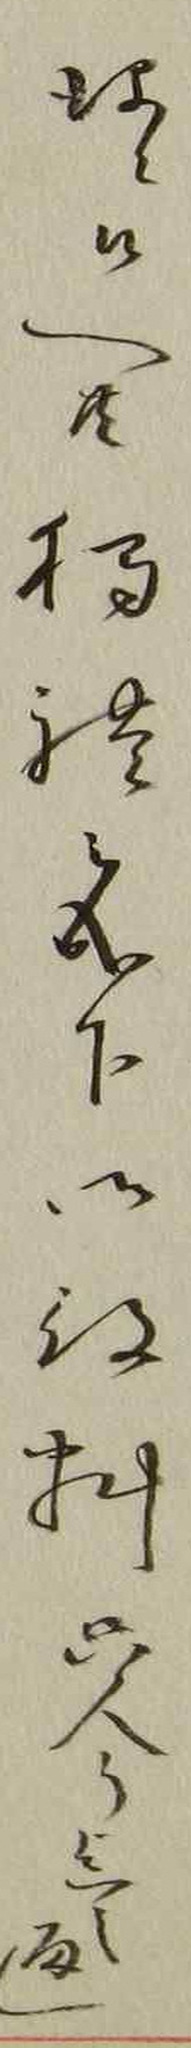儀ニ候へ共独礼被成下御役料只今迄之通
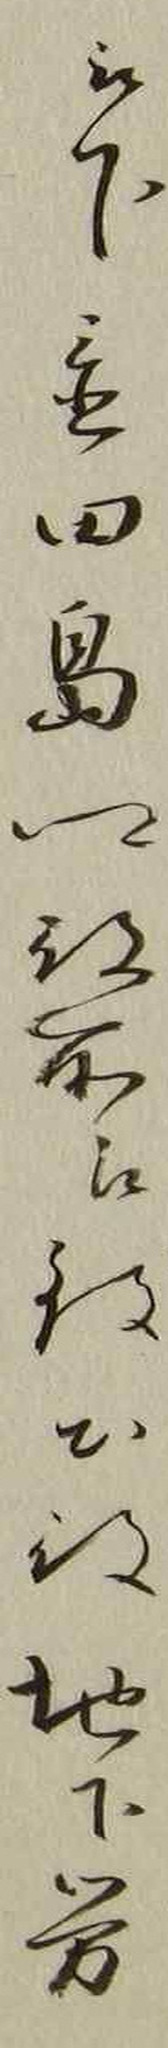被下置田島郷役所江致出役地下労
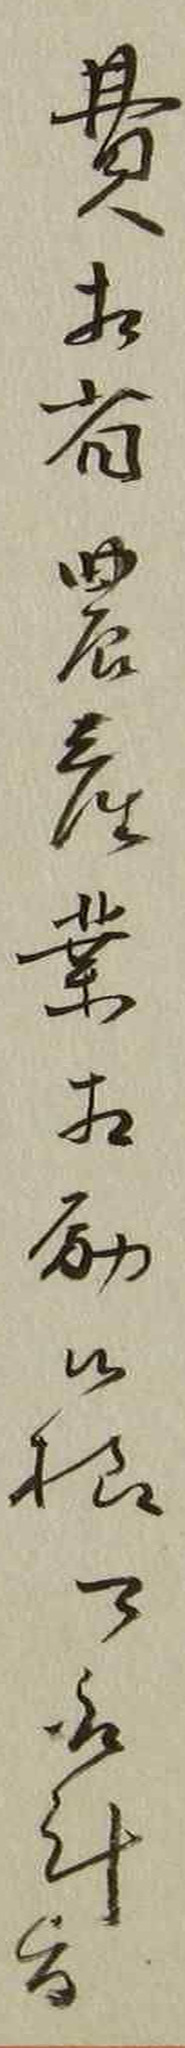費相省農産業相励候様可取計旨
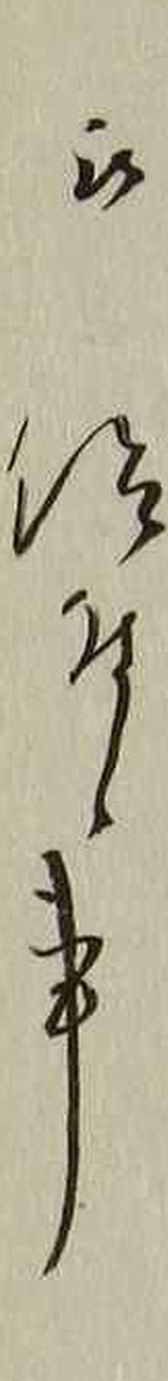被仰付候事
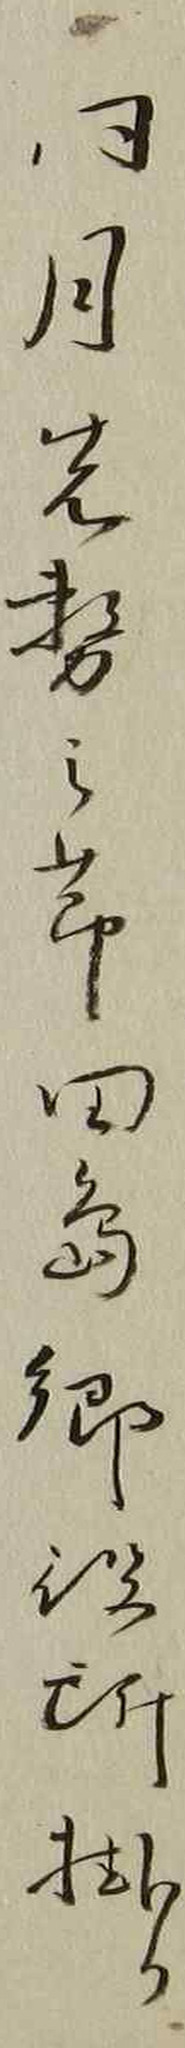一同月先務之節田島郷役所掛り
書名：諸士系譜　巻之8　い之部8
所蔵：会津若松市立会津図書館
